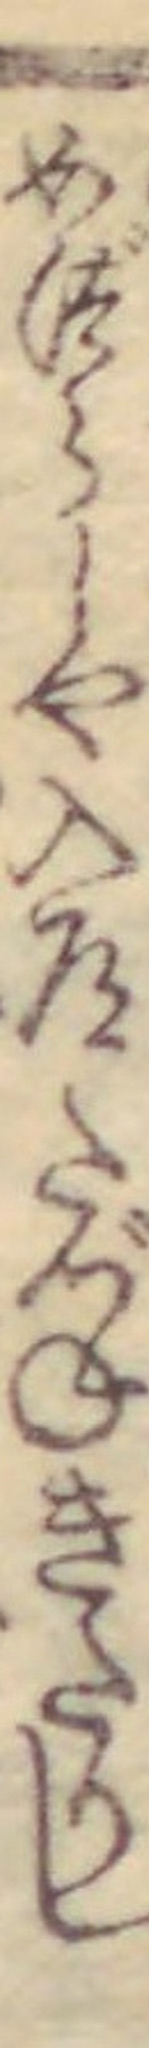めづらしや入道たづねきたりし
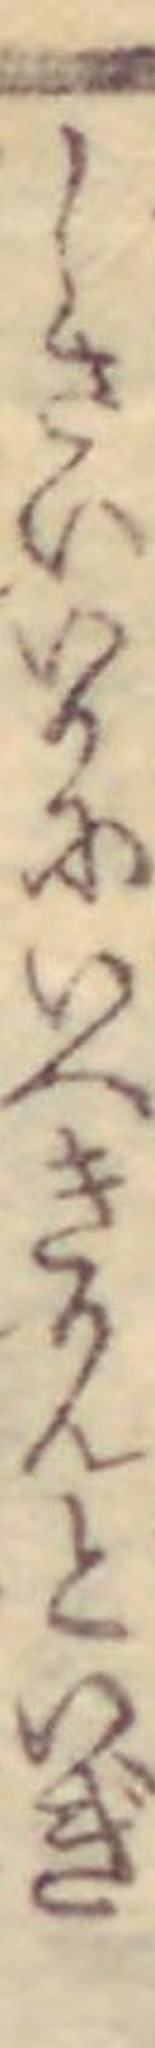しさいいかにいへきかんといぎ
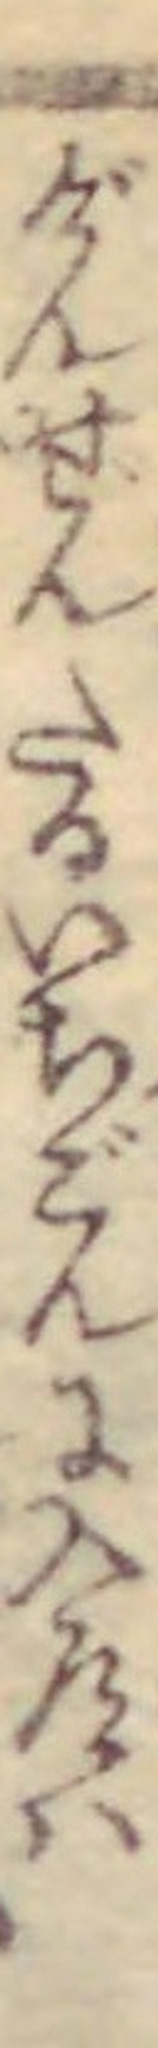げんせんたるいちごんに入道は
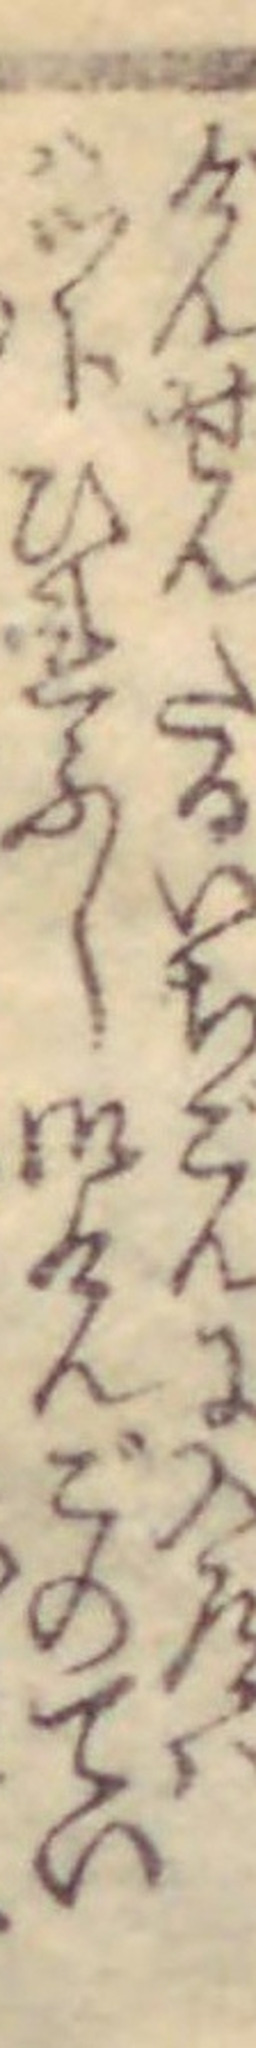ハットひれふし御けんごのてい
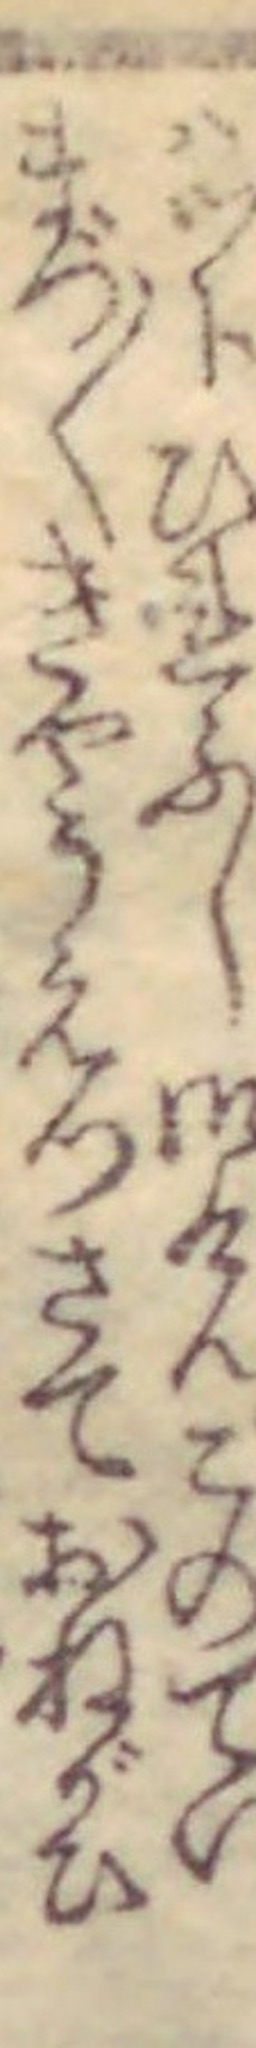まづ〳〵きやうえつさておねがひ
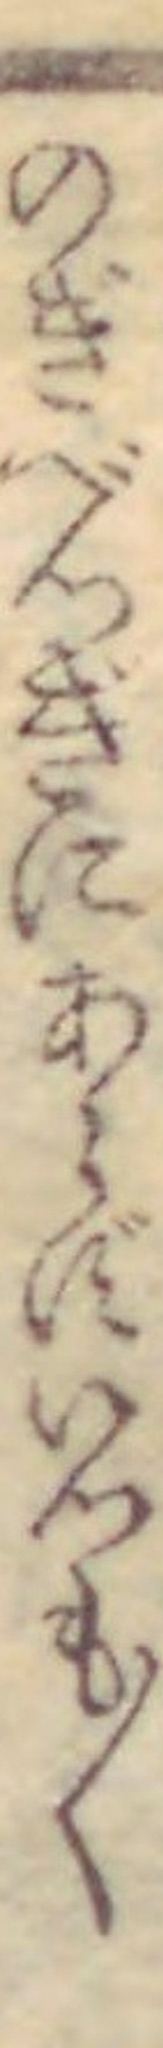のぎべつぎにあらずいつも〳〵
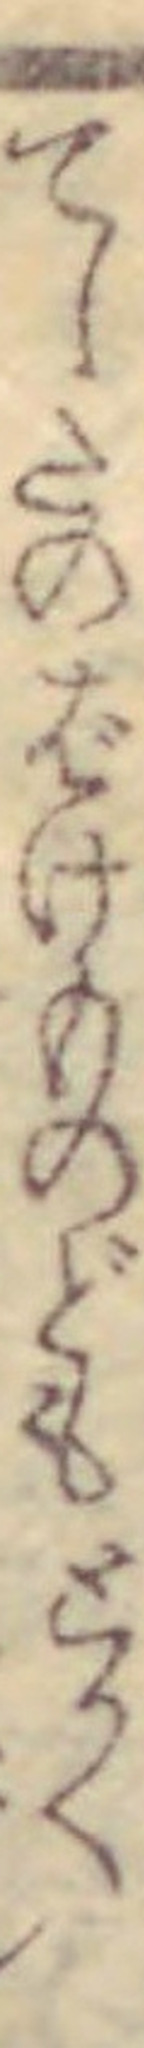てしたのばけものどもとかく
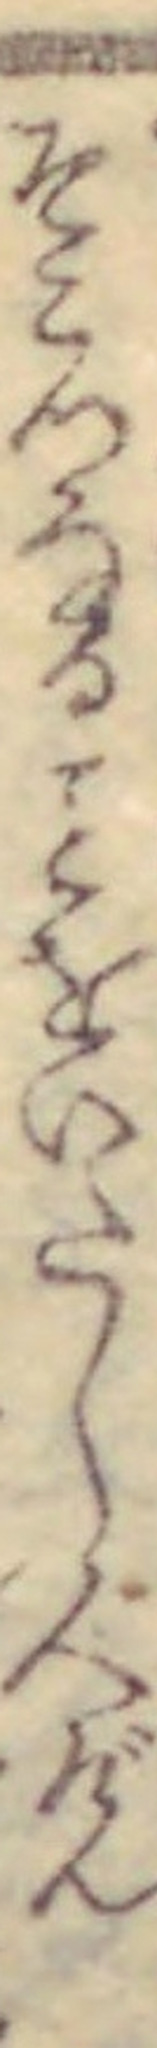そこつなることをいたし人げん
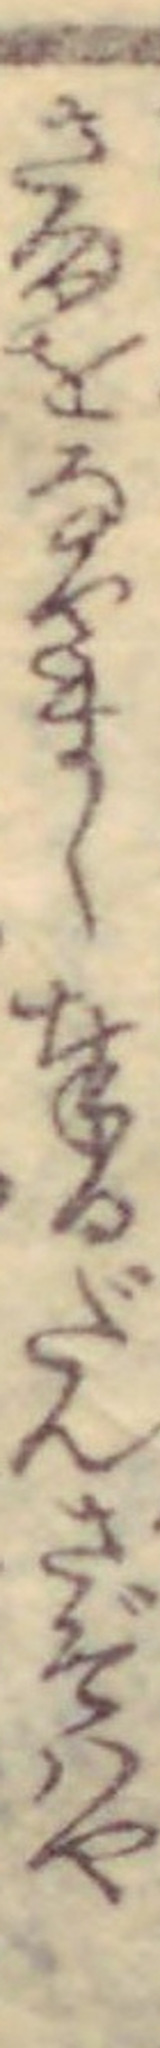さまをなやまし奉るだんさぞはや
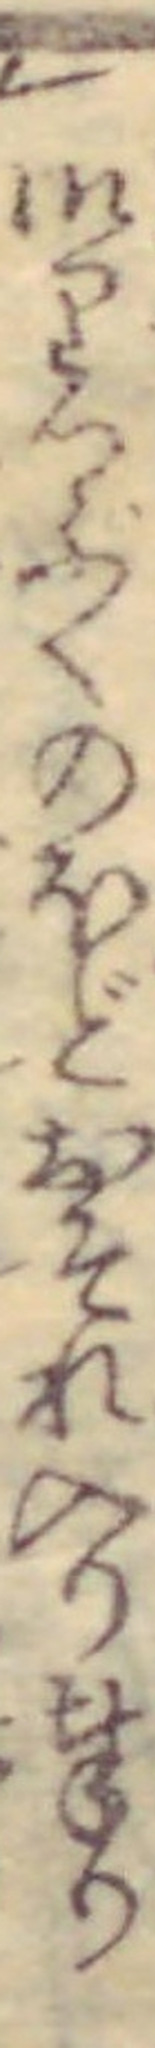御りつぷくのほどおそれ入り奉り
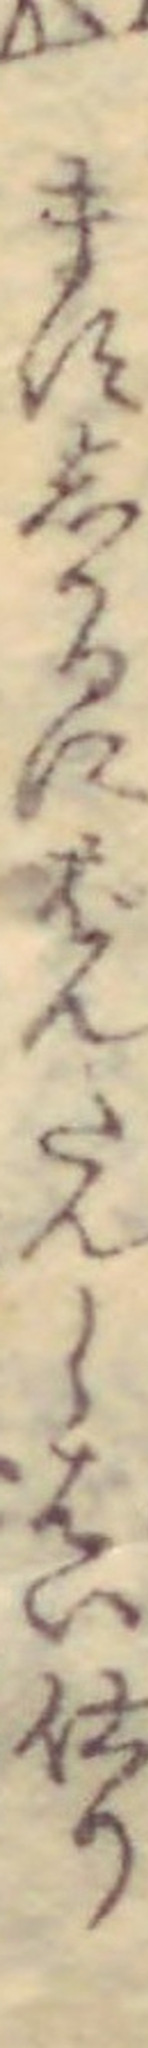ますしかるにばんたんしはい仕り
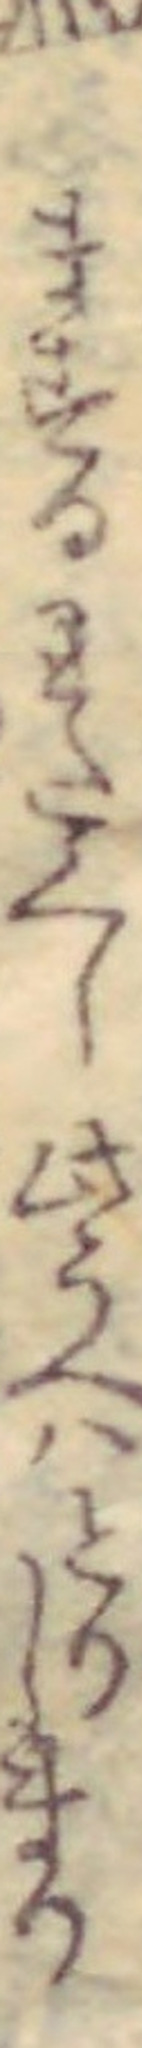まするわたくし此うへはとりしまり
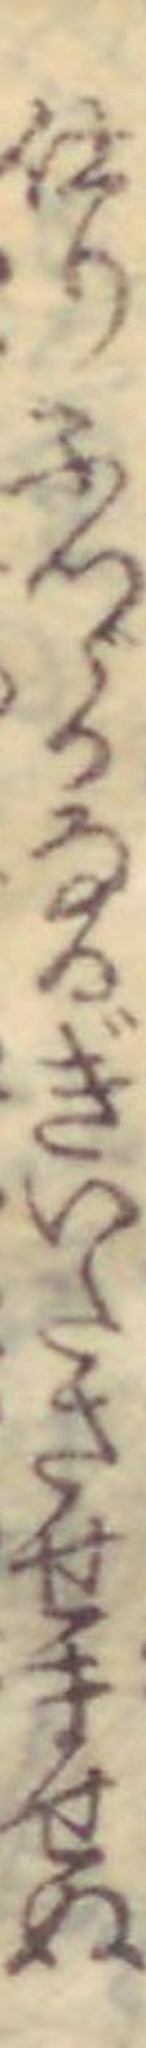仕りふつゞかなるぎいたさせませぬ
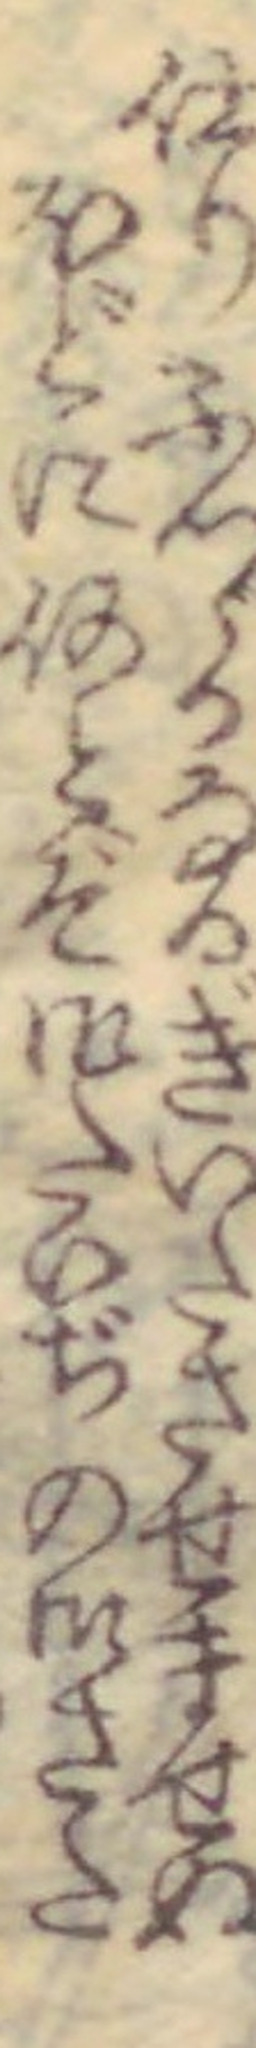ほどに何とぞ御たいぢの御さた
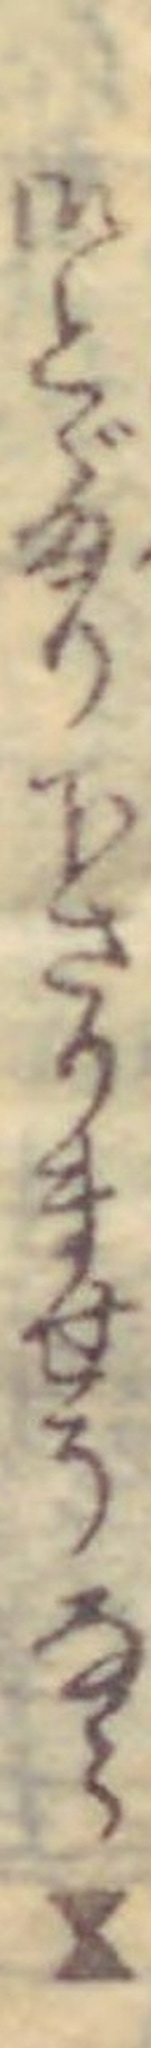御とゞまり下さりませうなら▼▲
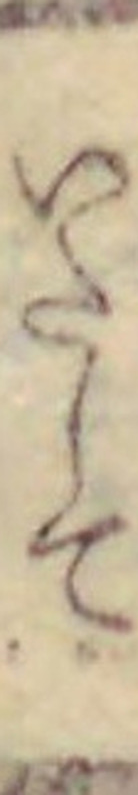いたして
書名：化物世帯氣質
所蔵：国立国会図書館 National Diet Library, JAPAN
